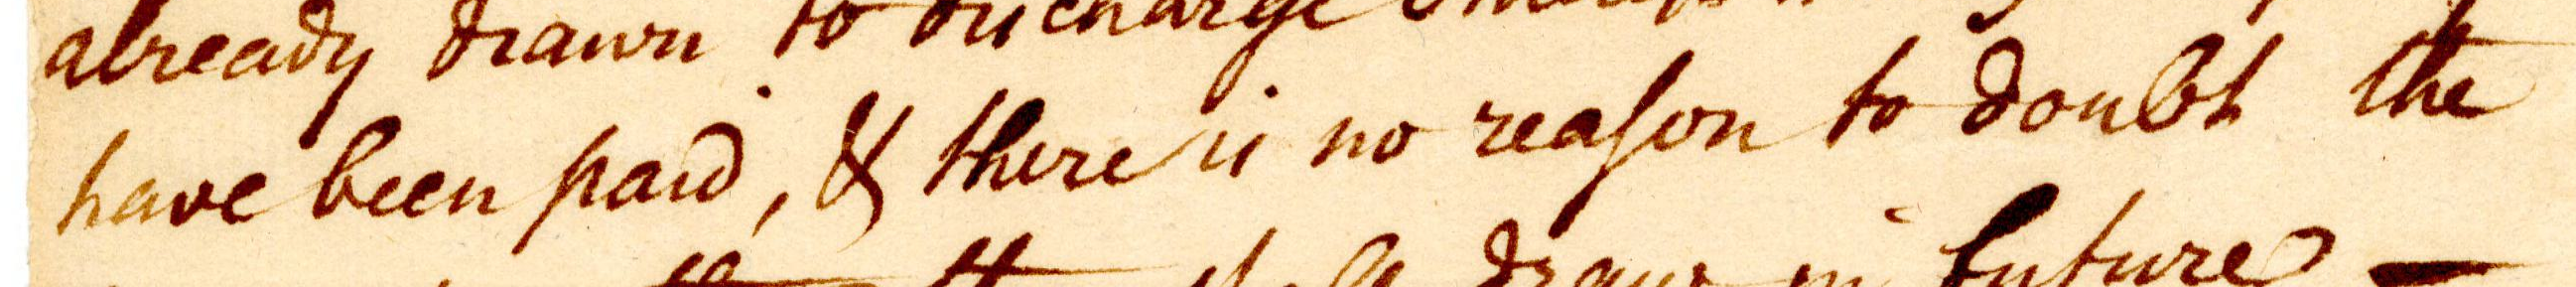have been paid, & there is no reason to doubt the
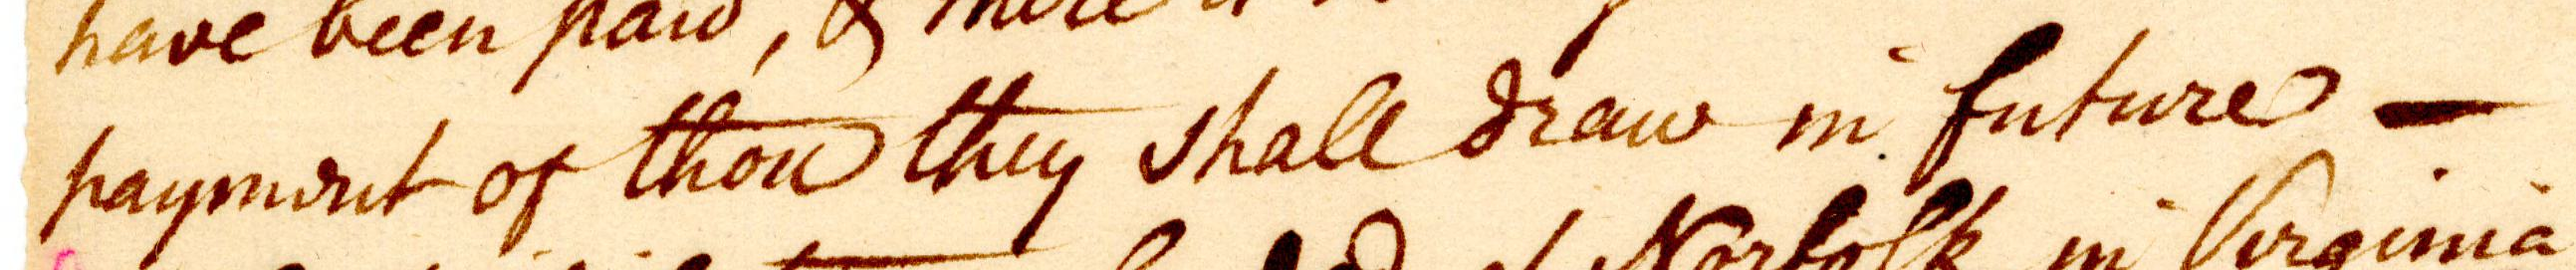payment or thou they shall drawn in future-
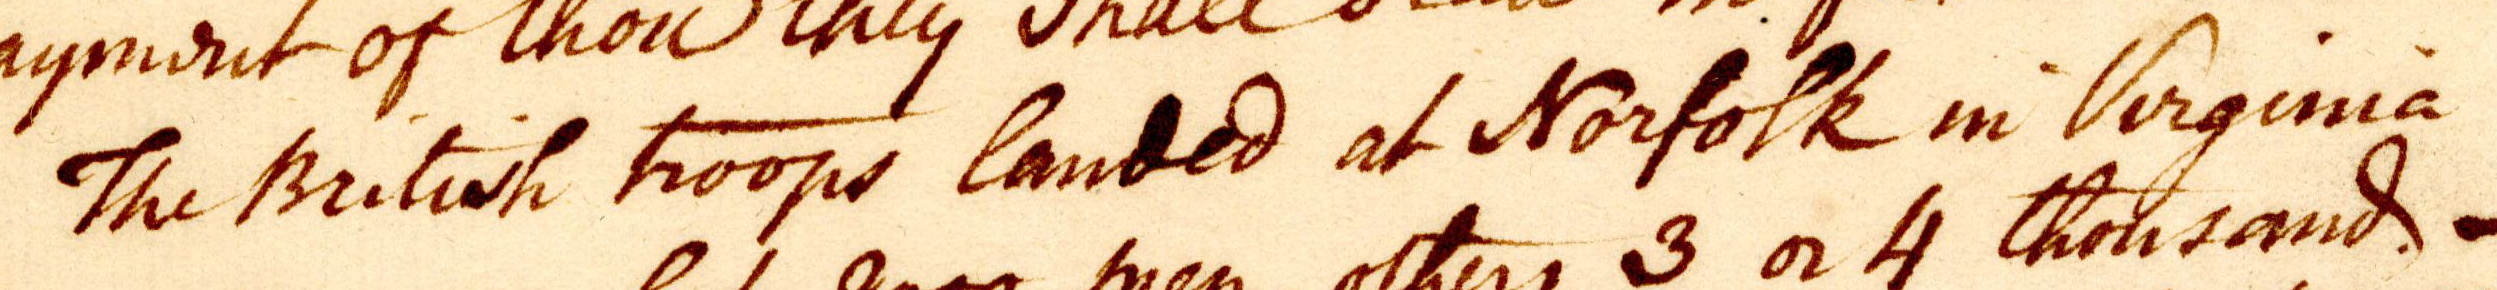The British troops landed at Norfolk in Virginia
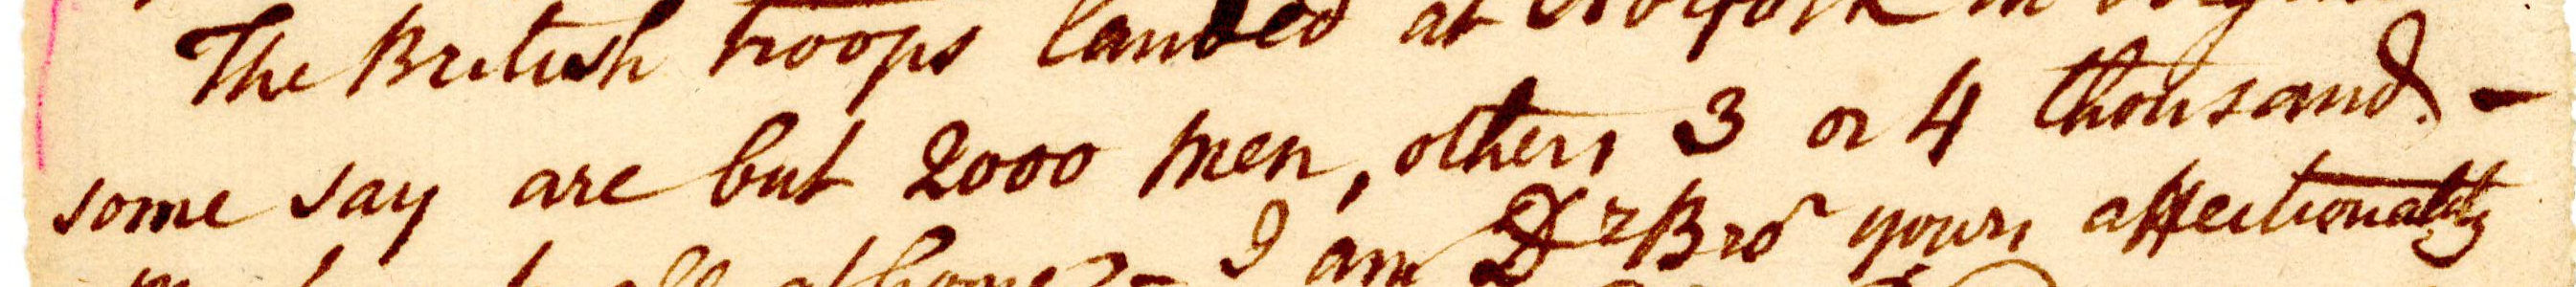some say are but 2000 men, other 3 or 4 thousand.-
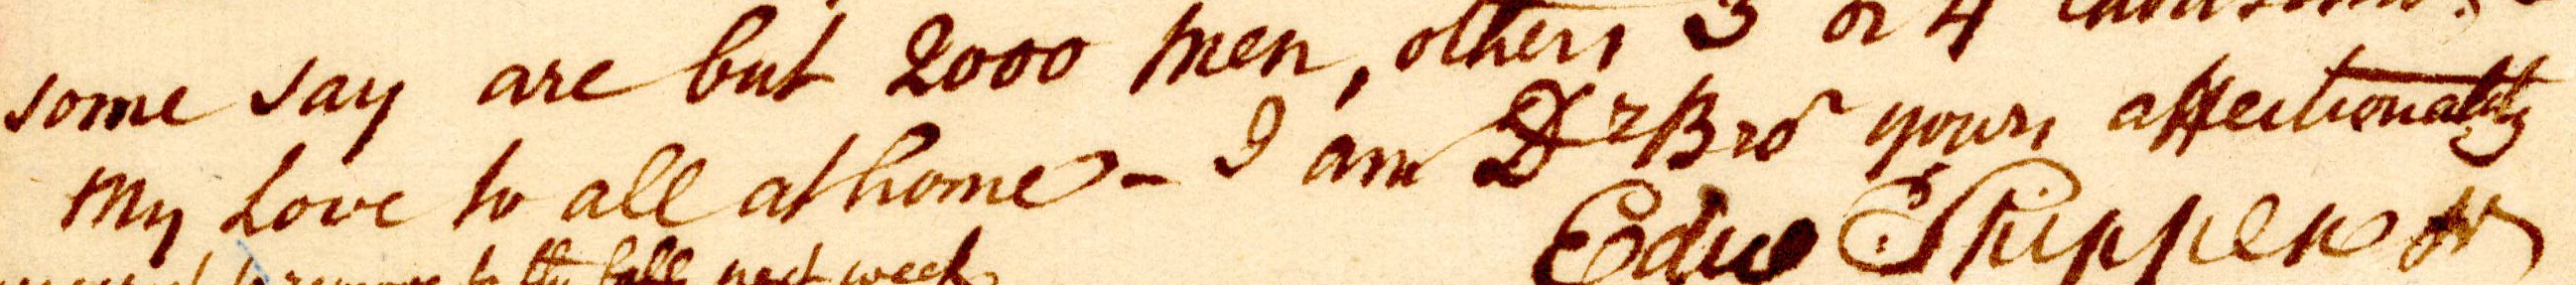My Love to all at home. I am D^r Bro^r yours, affectionately
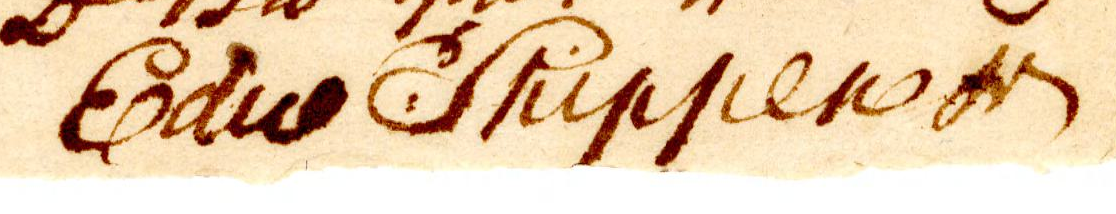Edw: Shippen Jr
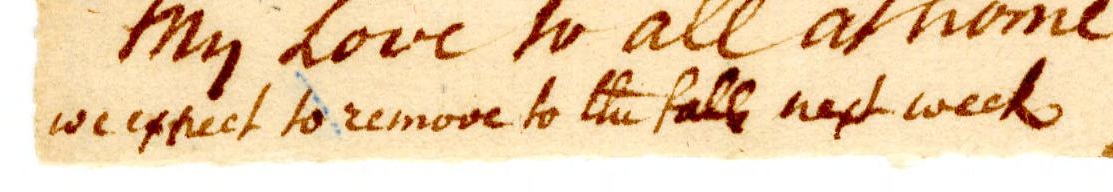we expect to remove to the falls next week
